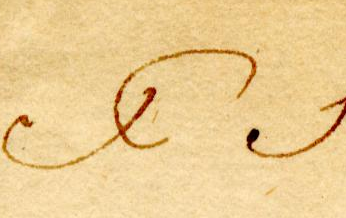PS
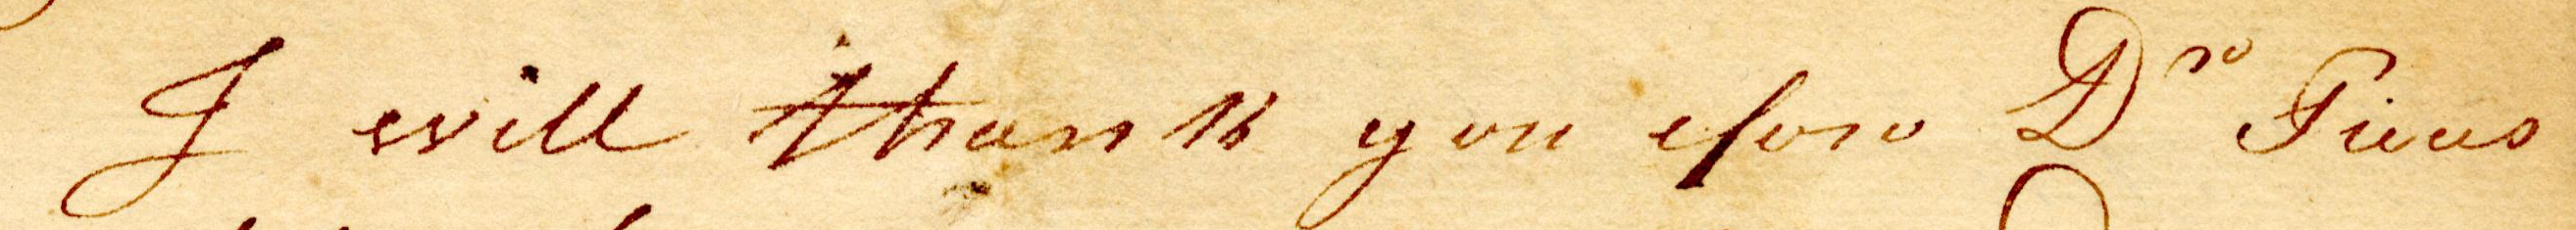I will thank you for D^r. Prices
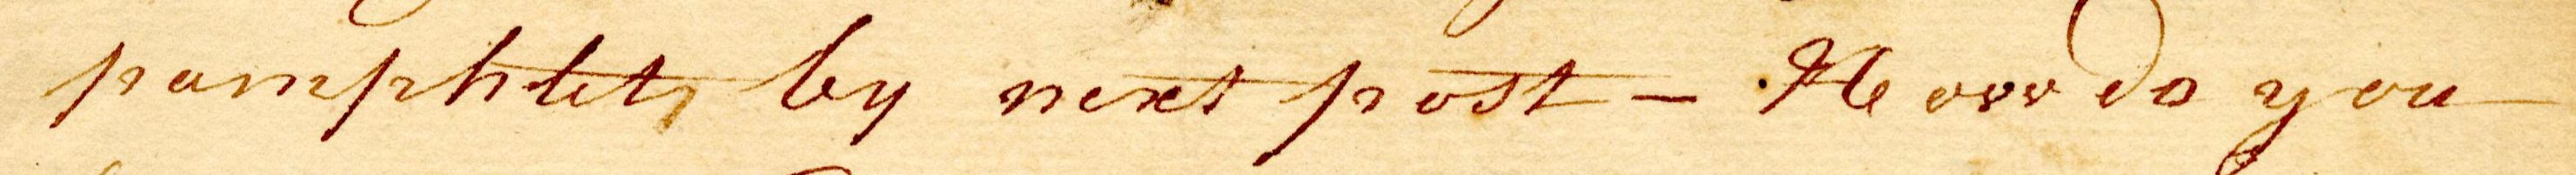pamphlets by next post- How do you
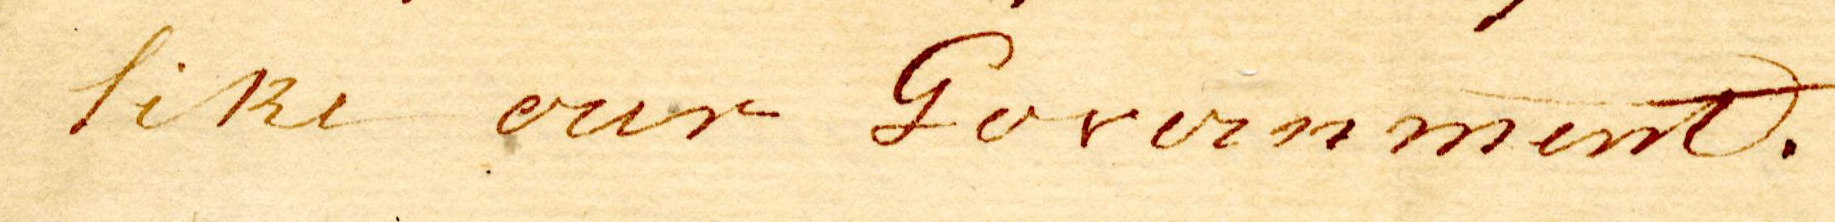like our Government.
